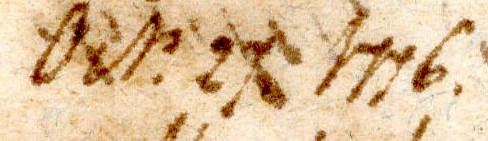Oct^r. 27 1776.
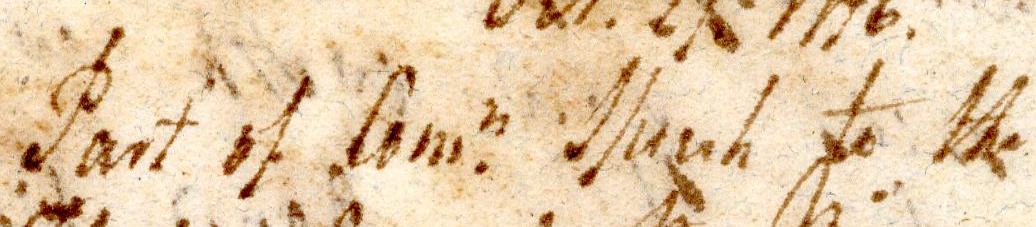Part of Com^r. Speech to the
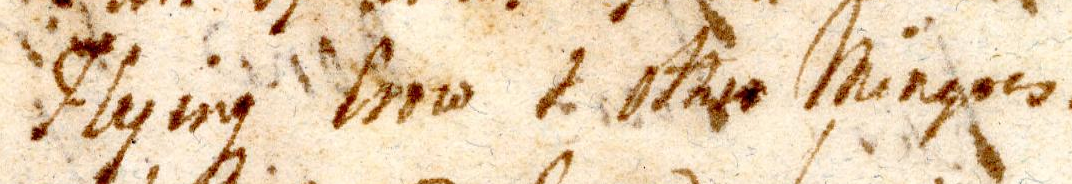Flying Crow & other Mingoes.
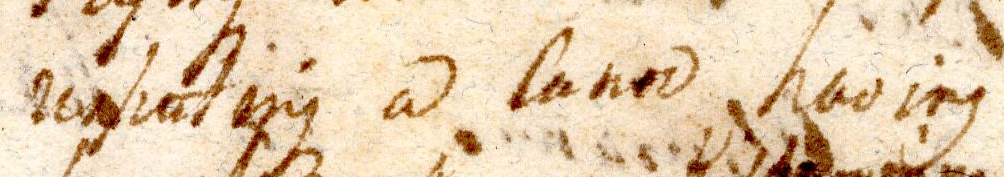respecting a Canoe having
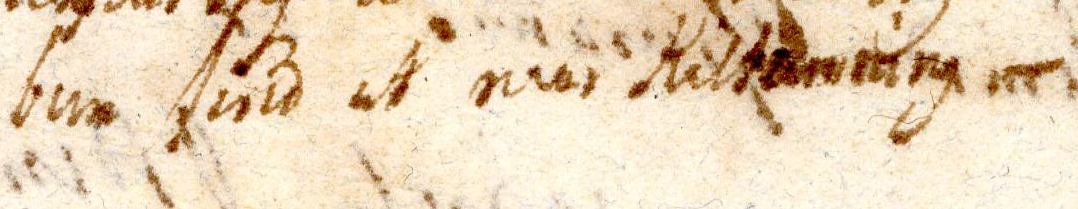been fired at near Kittanning-
